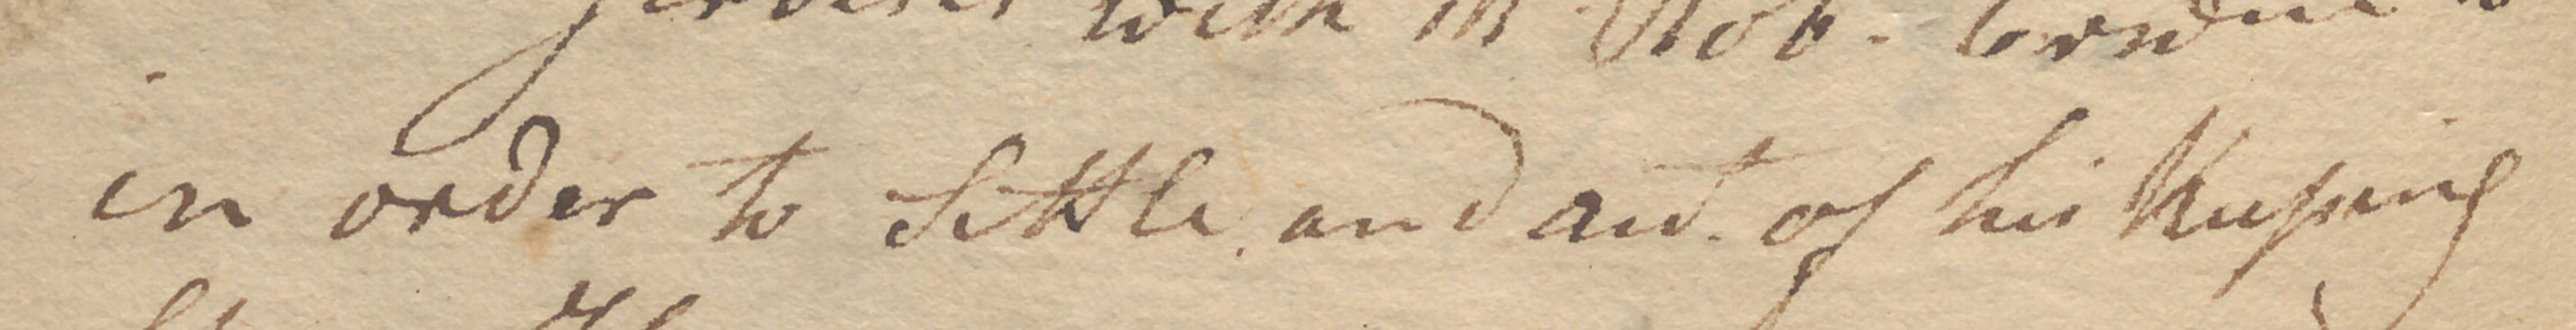in order to Settle and ac^t. of his Keeping
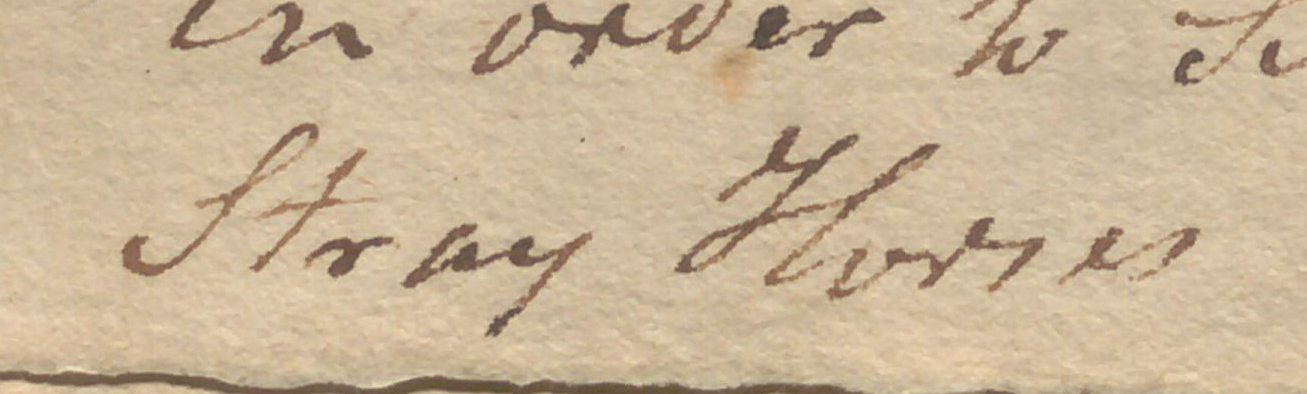Stray Horses
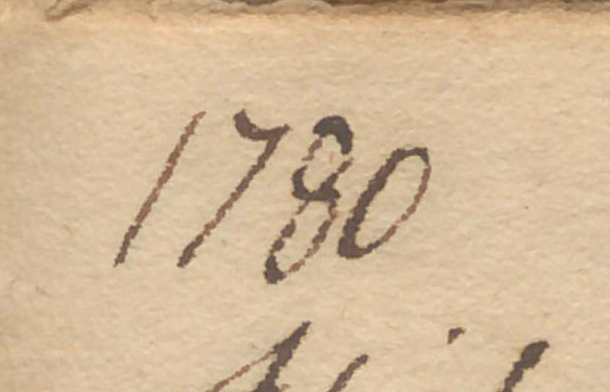1780
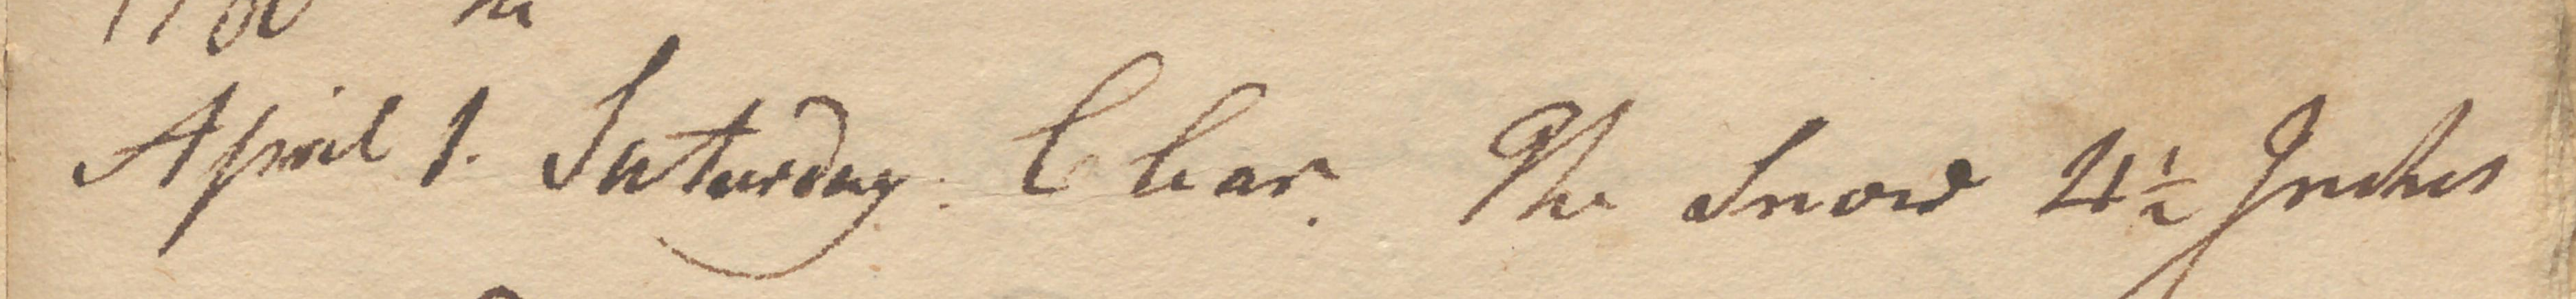April 1^th Saturday. Clear The Snow 4 1/2 Inches
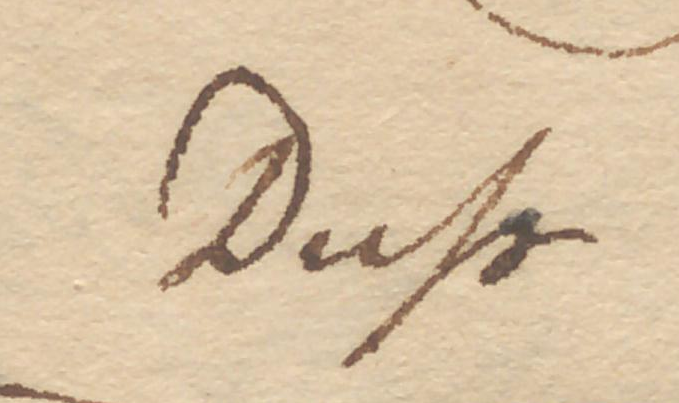Deep
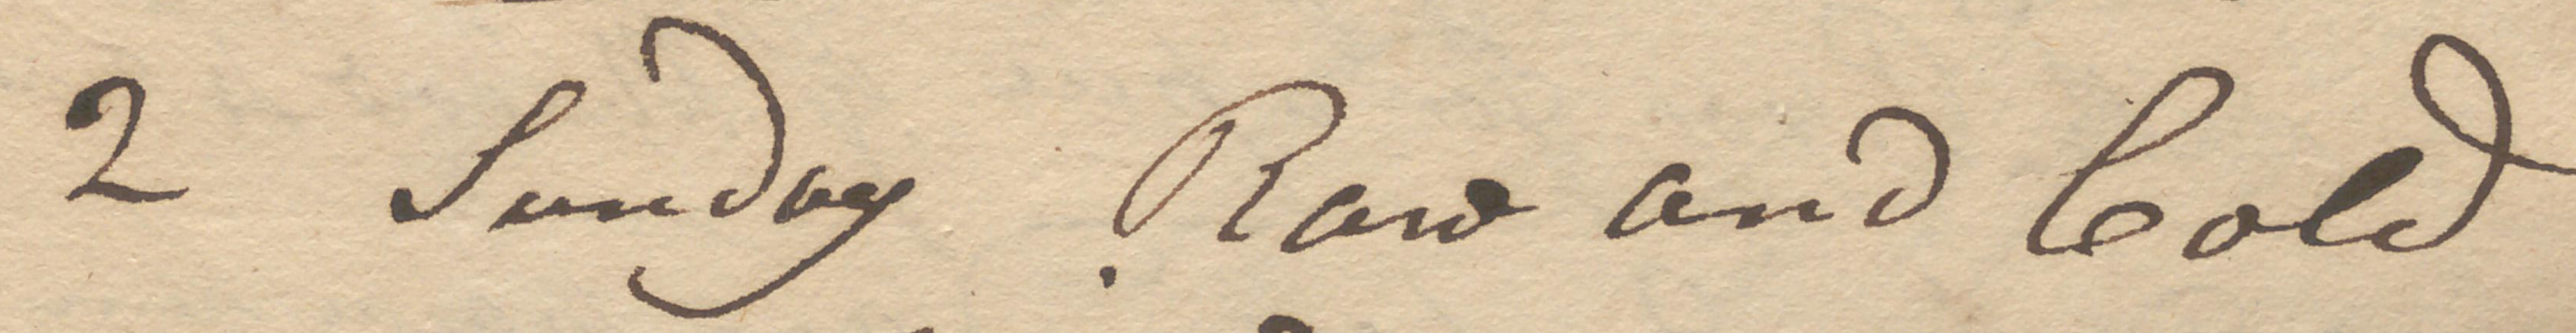2 Sunday Raw and Cold
